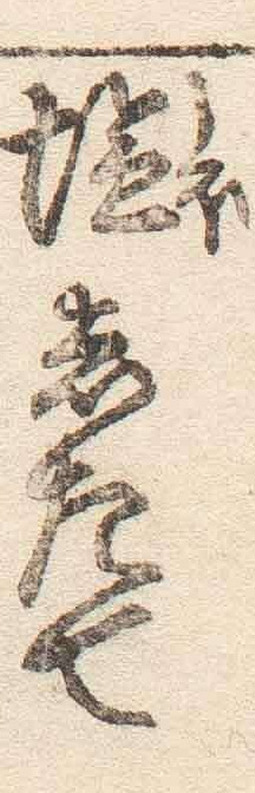塩したて
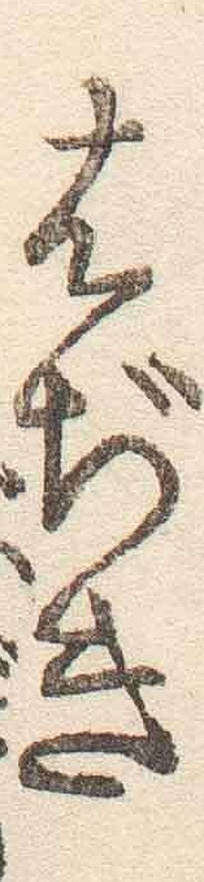はぢき
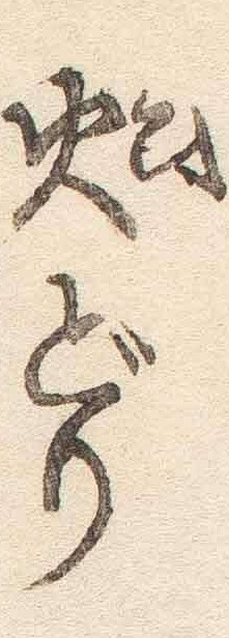火どり
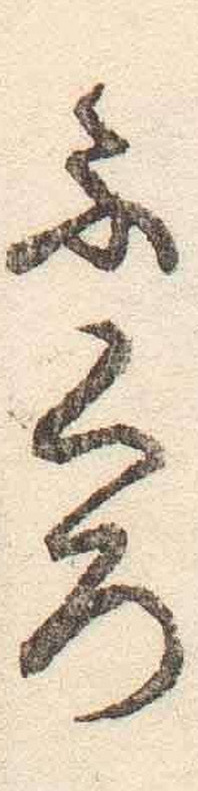ふくろ
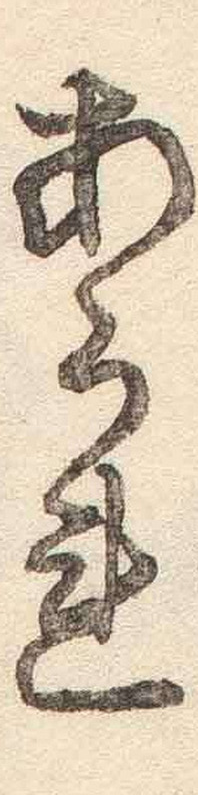あられ
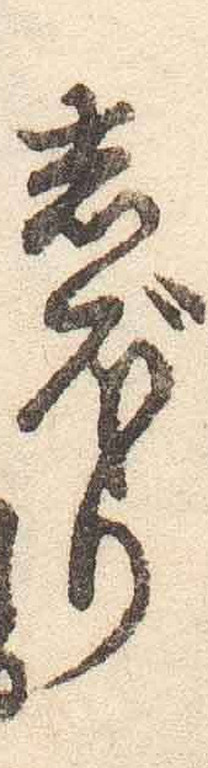しぼり
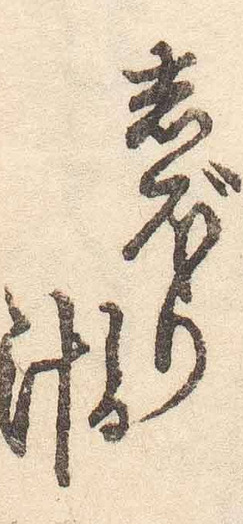しぼり
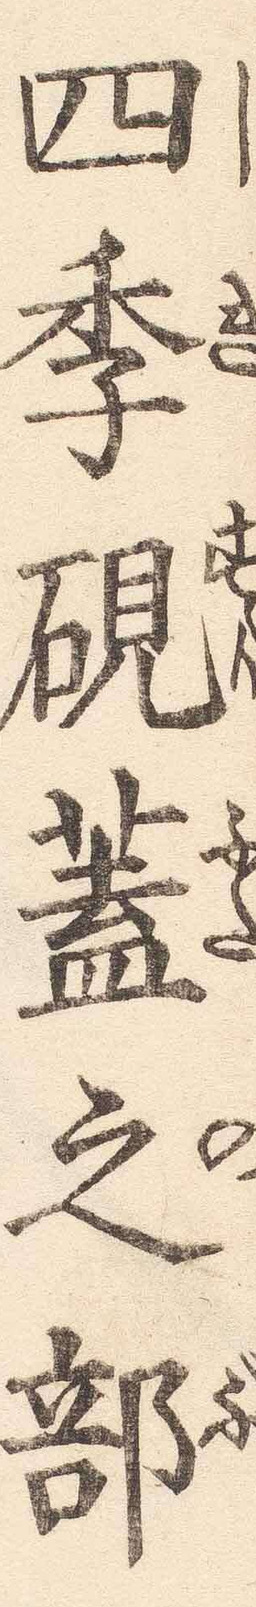四季硯蓋之部
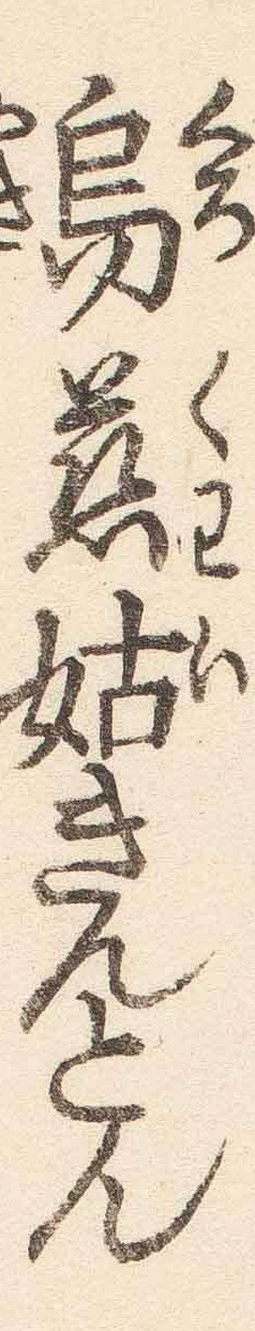烏慈姑きんとん
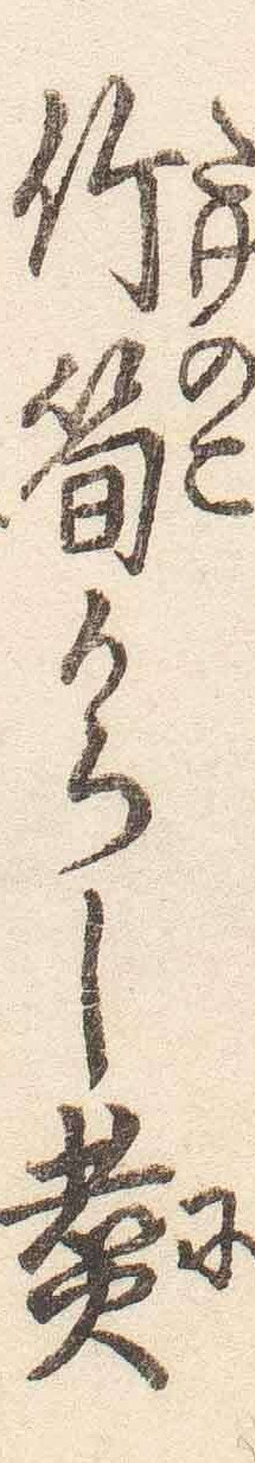竹筍からし煮
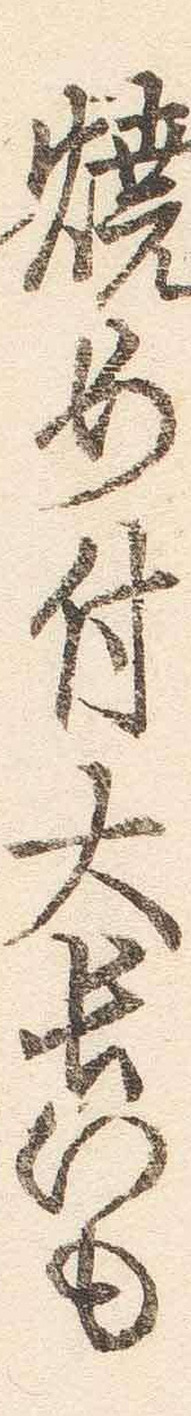焼め付大長いも
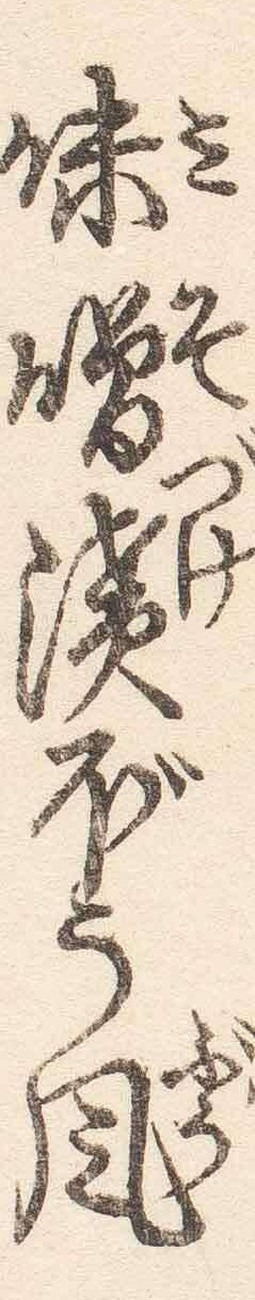味噌漬ぼう風
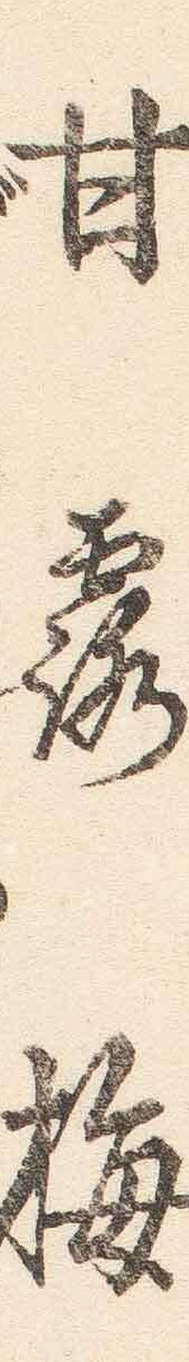甘露梅
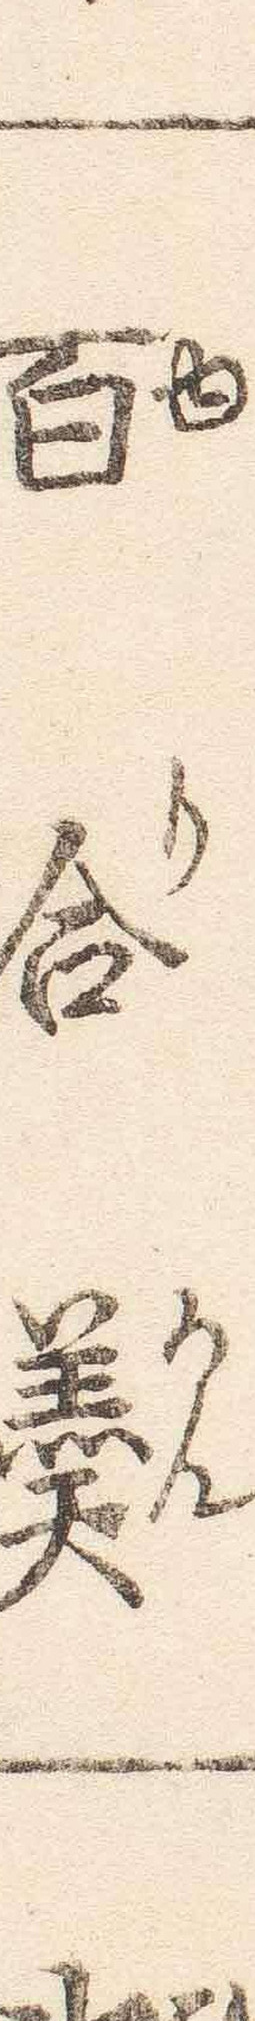百合羹
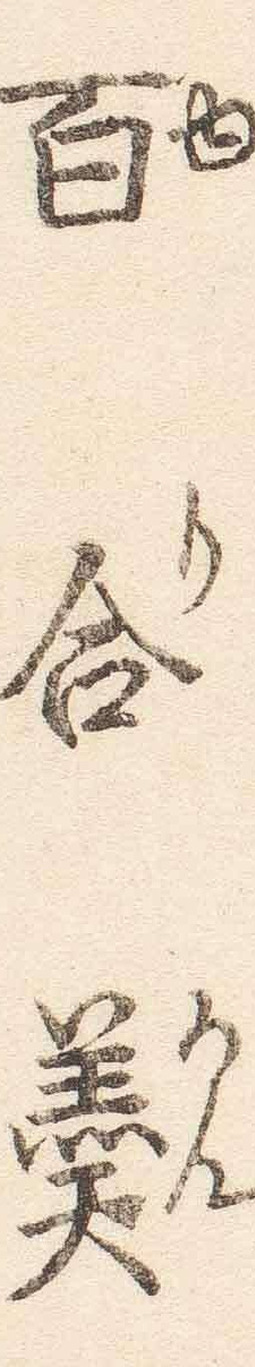百合羹
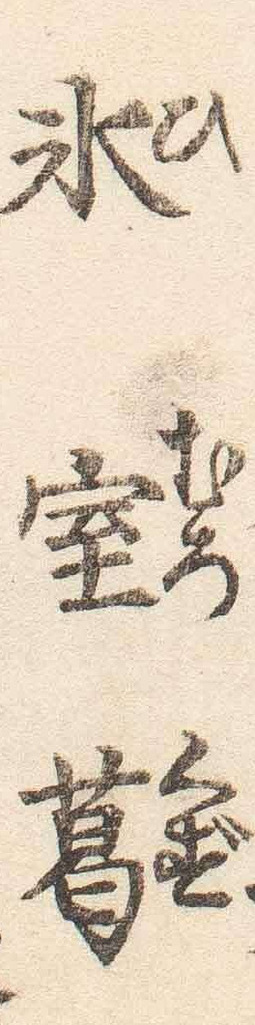氷室葛
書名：料理通
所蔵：東京学芸大学附属図書館 国文学研究資料館
